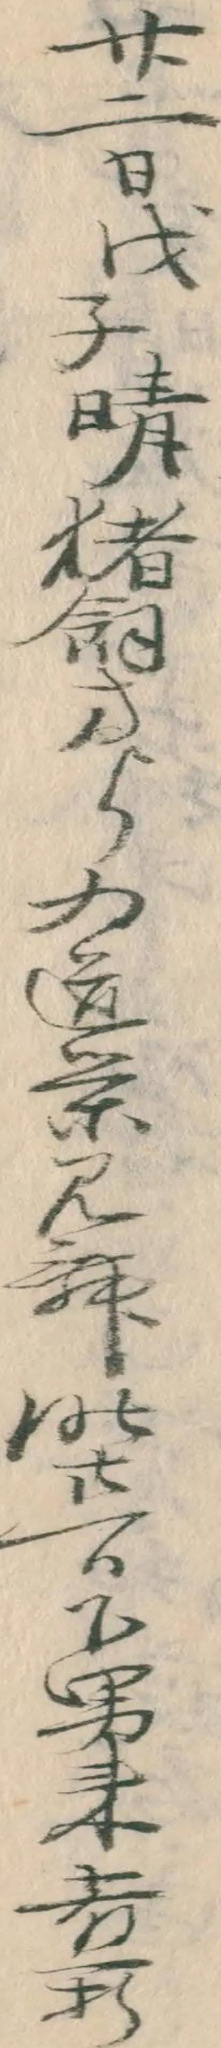廿二日戊子晴猪飼方より為道栄見舞昨廿一日下男来肴一折
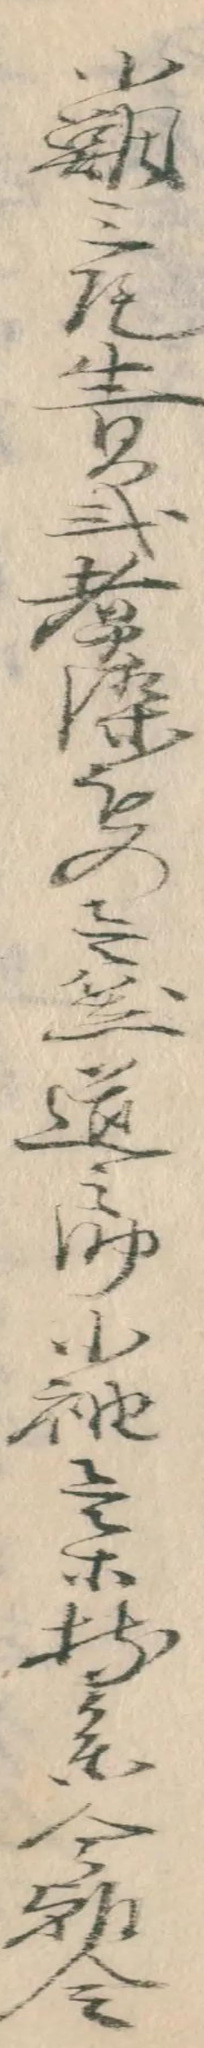小鯛三尾生貝弐煮染もの壱器道之助小袖壱等持参今朝食
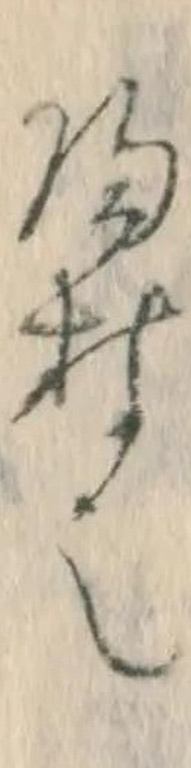帰村也
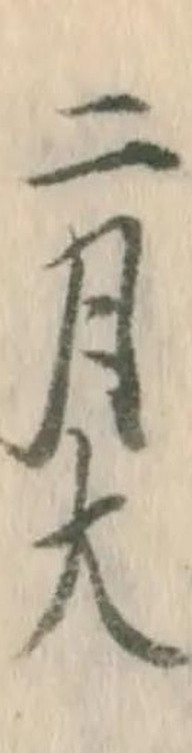二月大
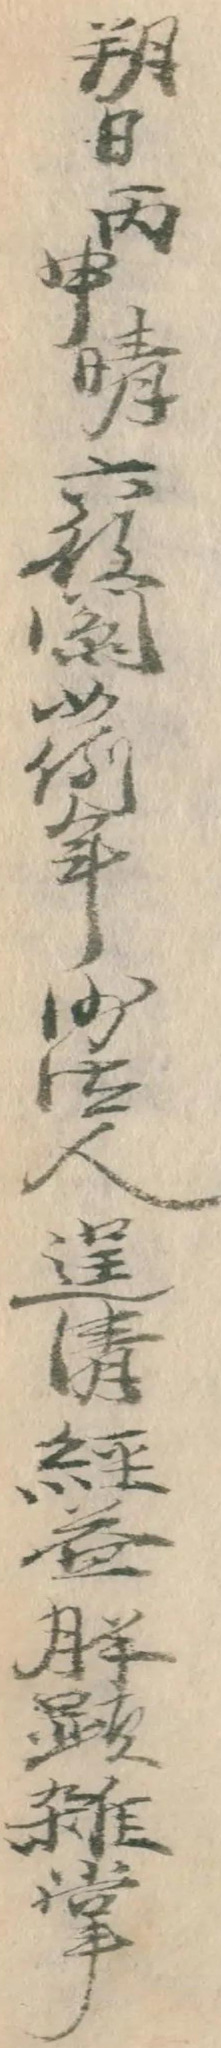朔日丙申晴六役鬮如例年沙汰人逞清経益胖顕雑掌

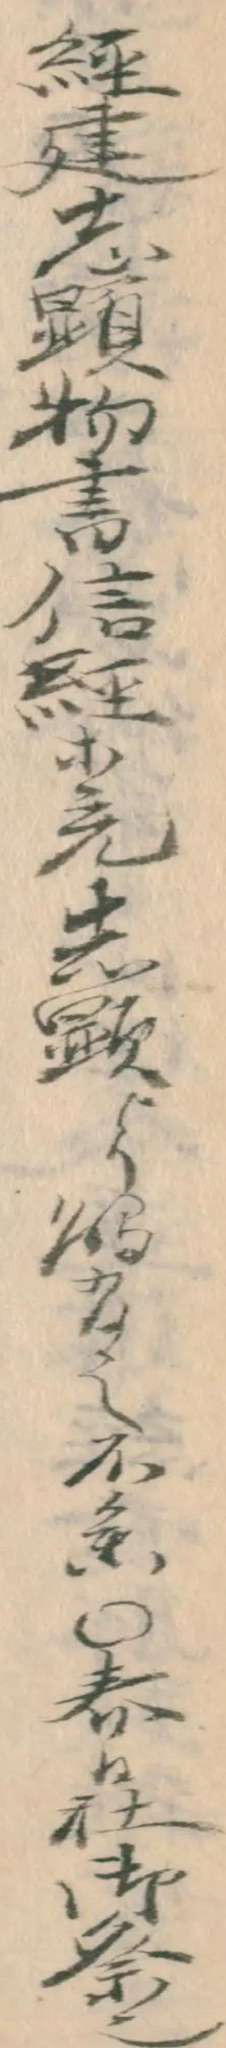経建志顕物書信経等充志顕より觸有之不参○春日社御祭也
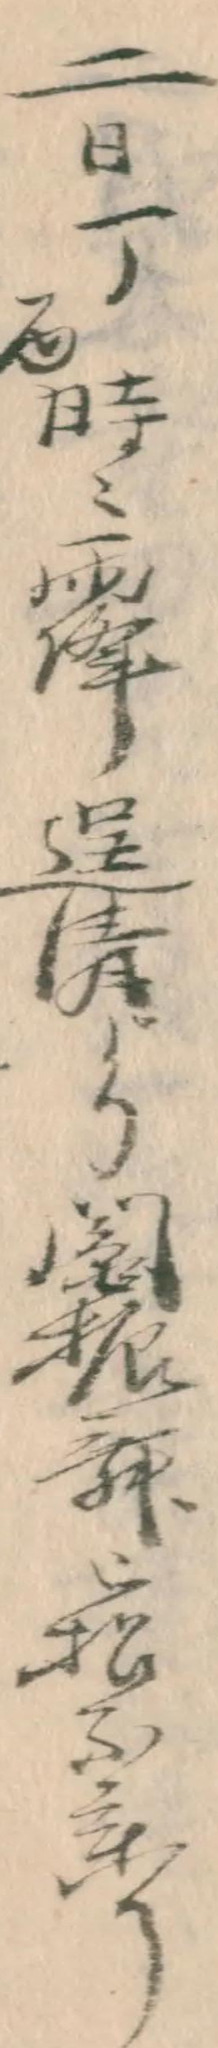二日丁酉時々雨降逞清より鬮振舞被招不参了
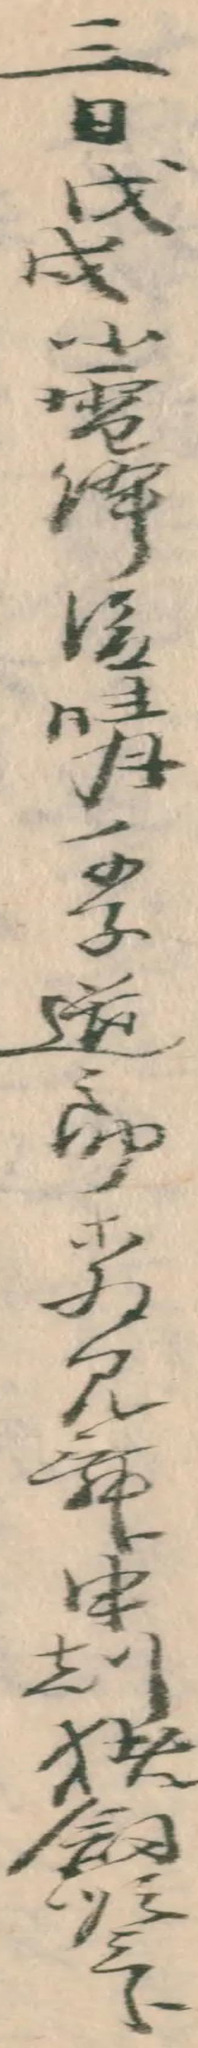三日戊戌小雪降後晴千子道之助等為見舞候申刻猪飼順三郎
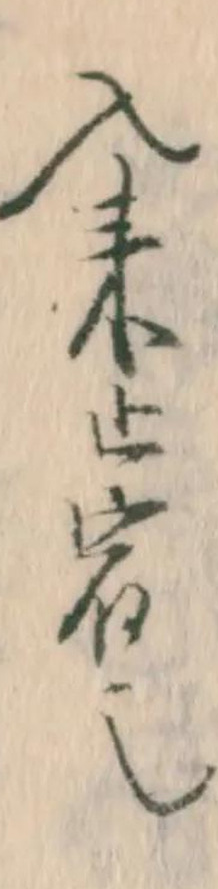入来止宿也
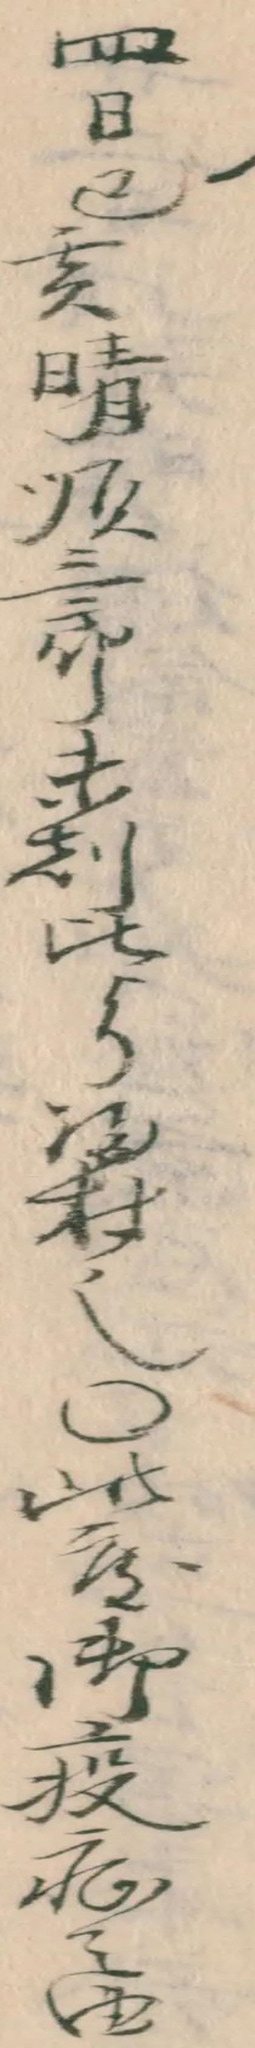四日己亥晴順三郎未刻比より帰村也○此度御疫症之由
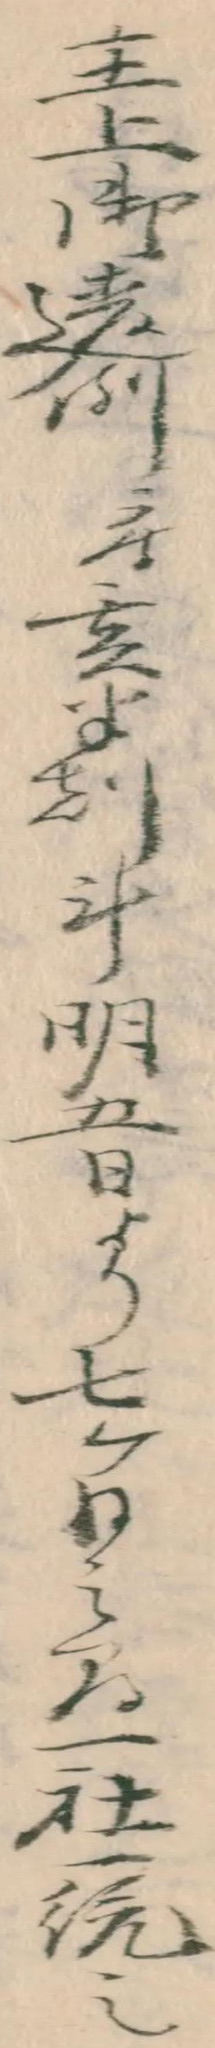主上御違例ニ付亥半刻斗明五日より七ケ日之間一社一統之
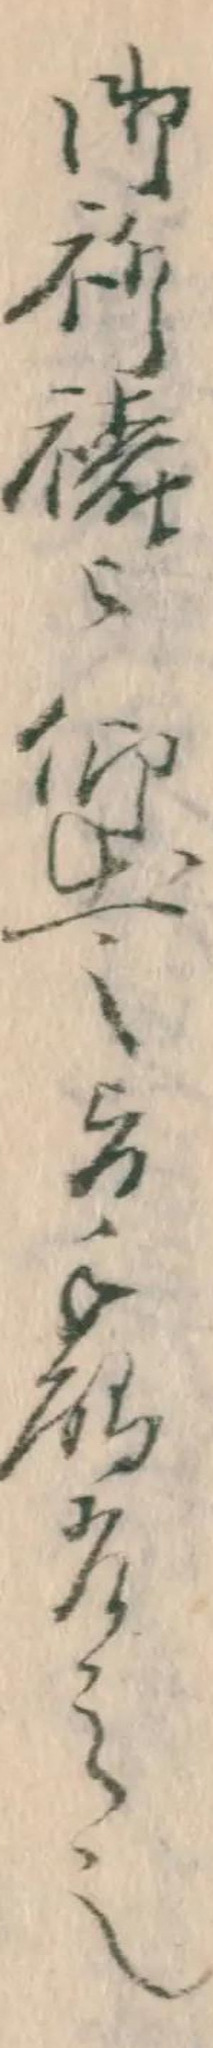御祈祷被仰出之旨手觸有之也
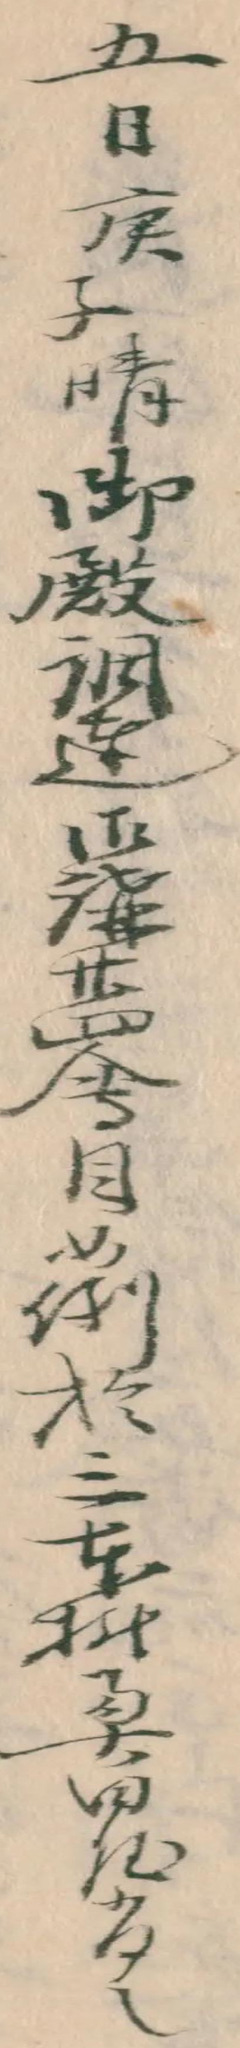五日庚子晴御殿調達御講廿四會目如例於三本樹奥田屋有之
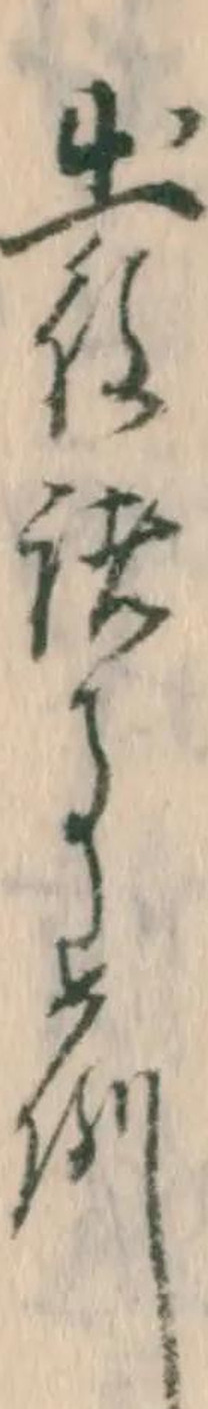出役諸事如例
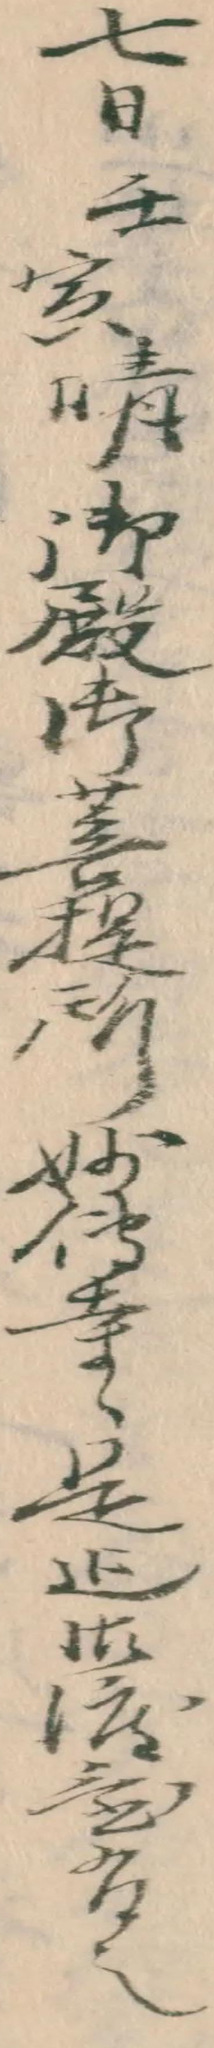七日壬寅晴御殿御菩提所妙傳寺へ是迄御渡置有之
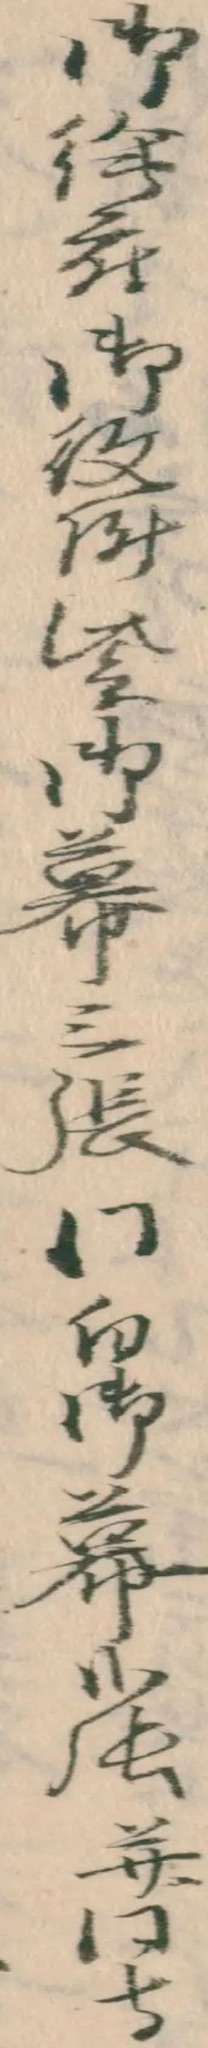御繪ニ付御紋附紫御幕三張同白御幕弐張并同寺
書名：賀茂社記録. 第66冊
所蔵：国立国会図書館 National Diet Library, JAPAN
